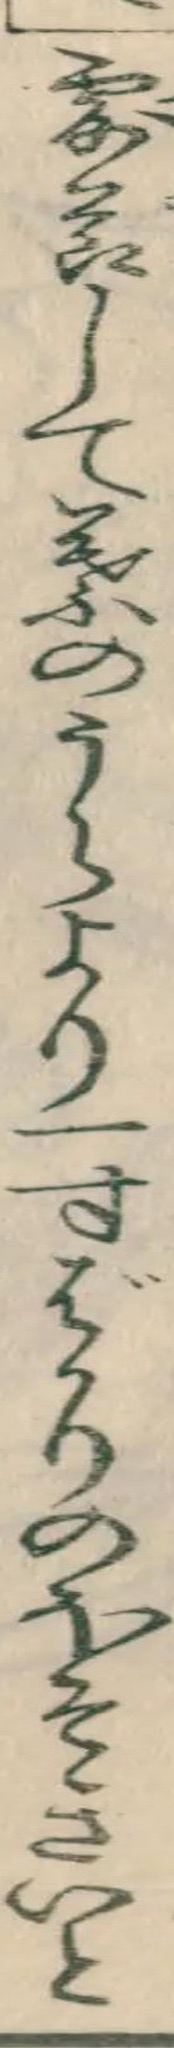露節して葉のうらより一寸ばかりのほそきいと
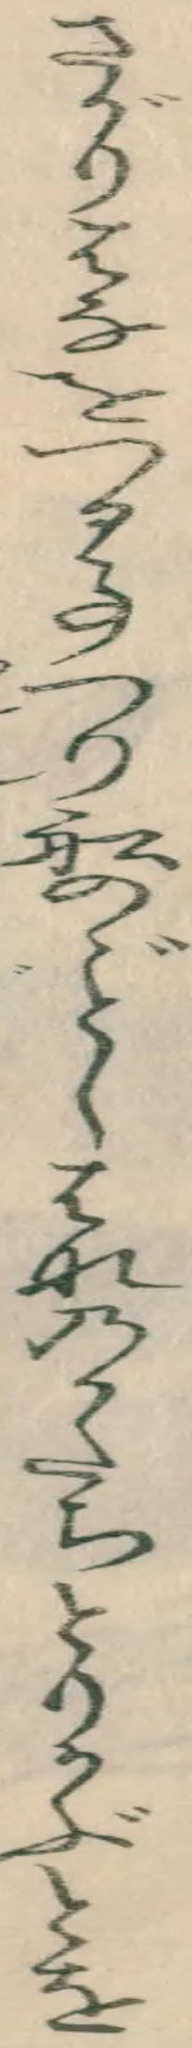さがりはなをつる事つり船のごとしはなのかたちとりかぶとを
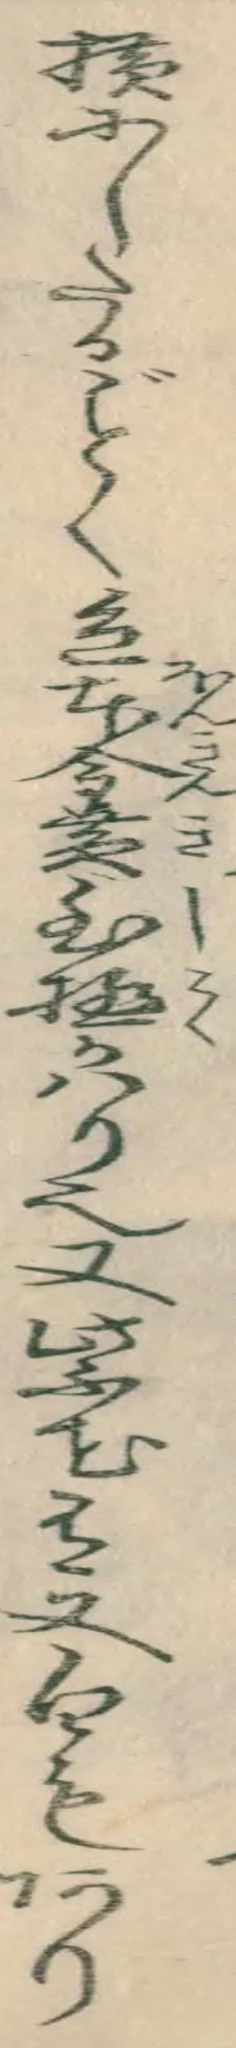横にしたるごとく色本金黄至極かはり也又紫花有又白もあり
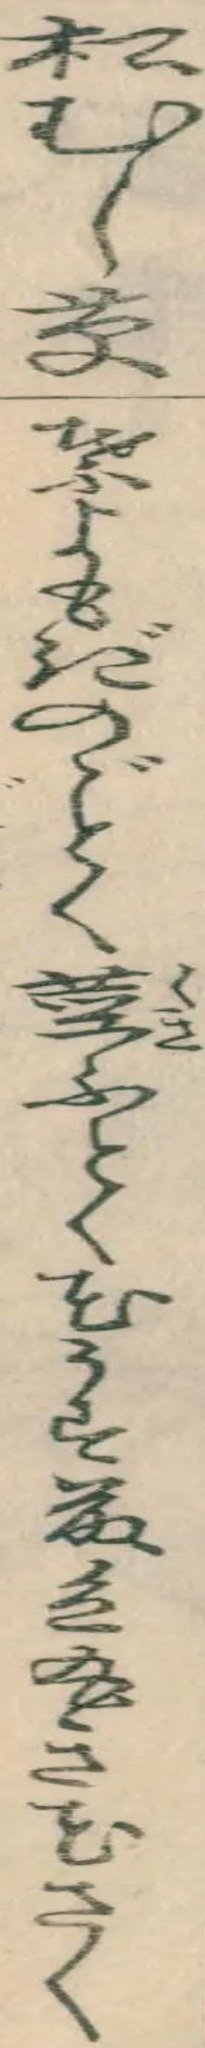[松むし草]葉よもぎのごとく茎ふとく花うす藤色丸き花さく
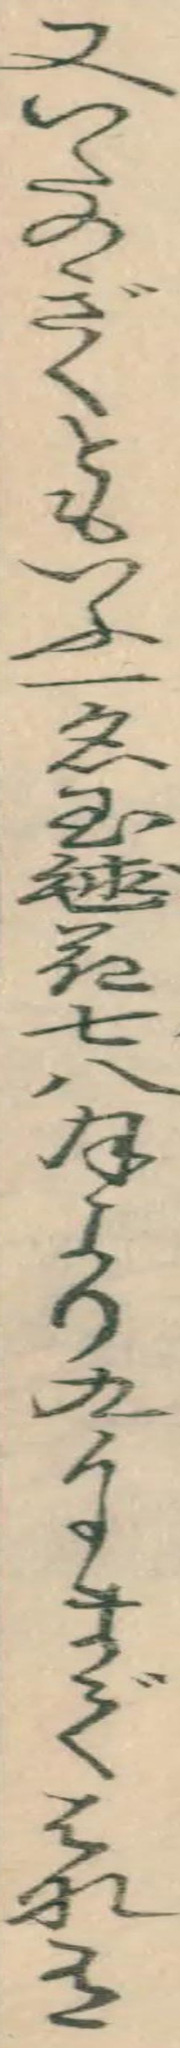又いたのぎくともいふ一名玉毬花七八月より九月まではな有

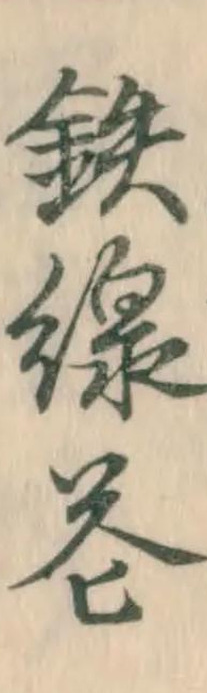鉄線花

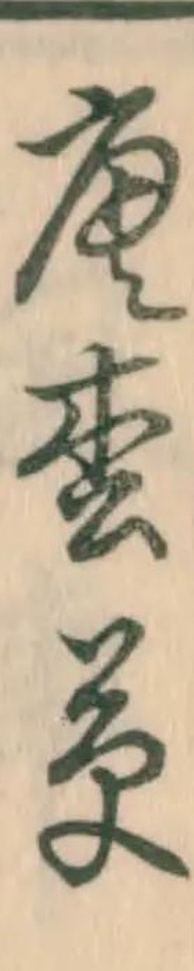唐松草
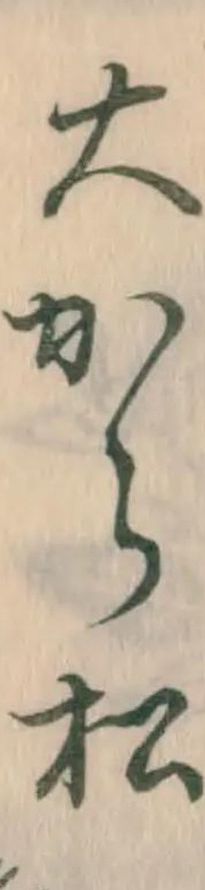大から松
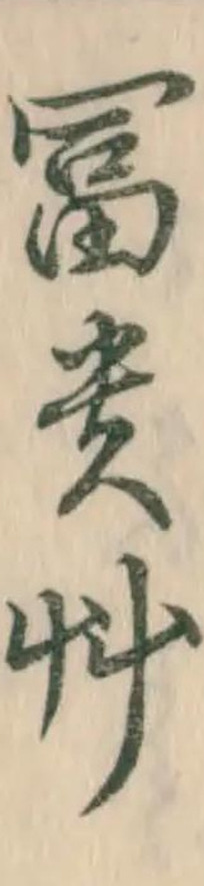富貴艸

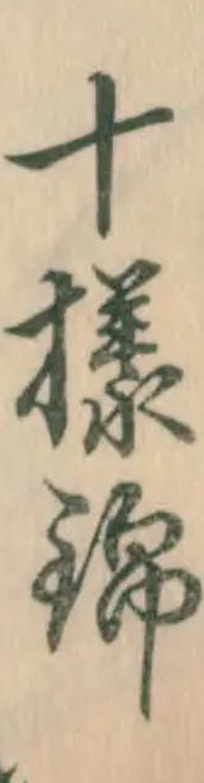十様錦
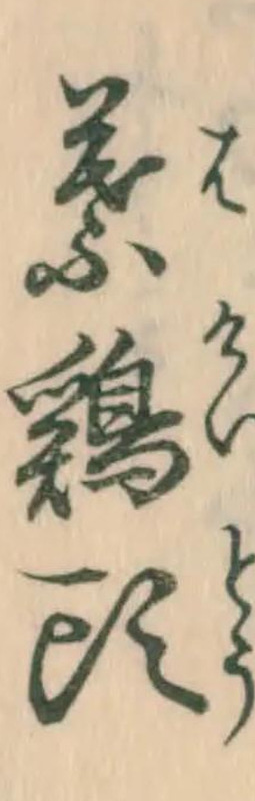葉鶏頭
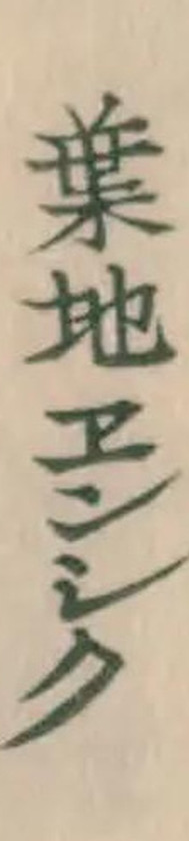葉地ヱンシク
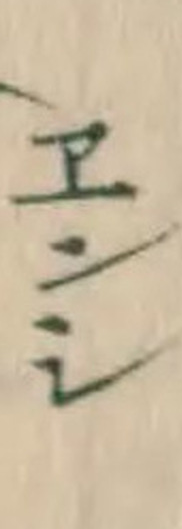ヱンシ
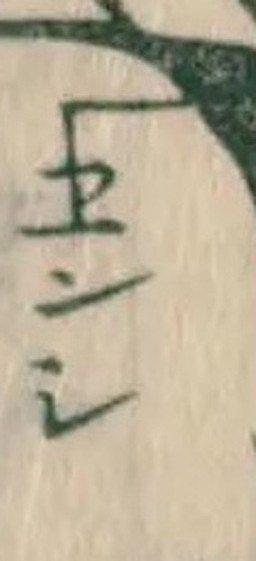ヱンシ
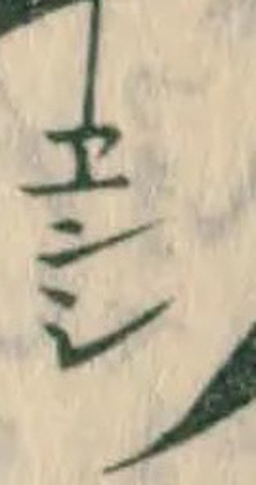ヱンシ
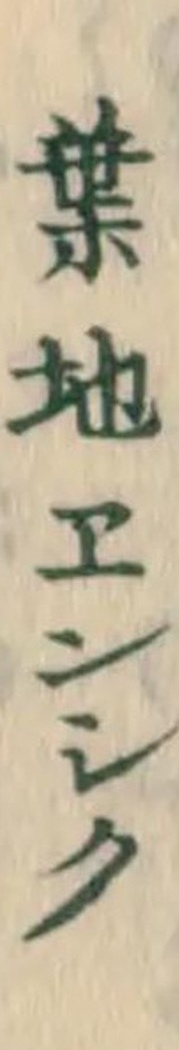葉地ヱンシク
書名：畫本野山草. [5]
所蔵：国立国会図書館 National Diet Library, JAPAN
